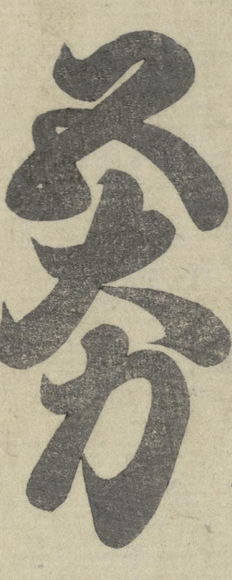五大力
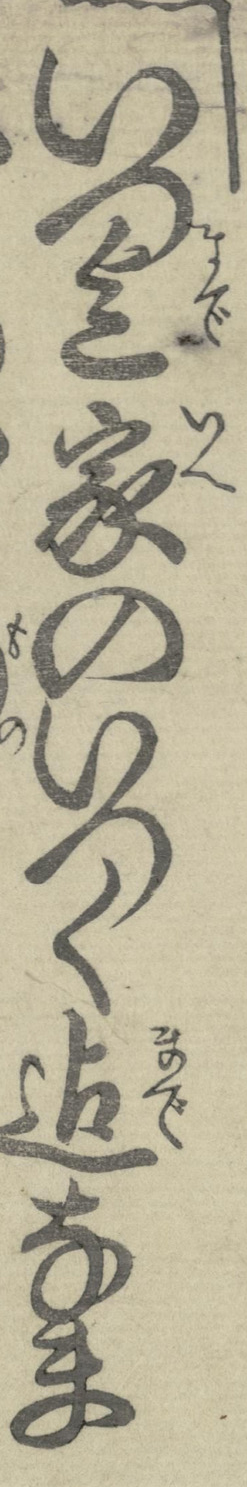￢いつ迄家のいつく迄なま
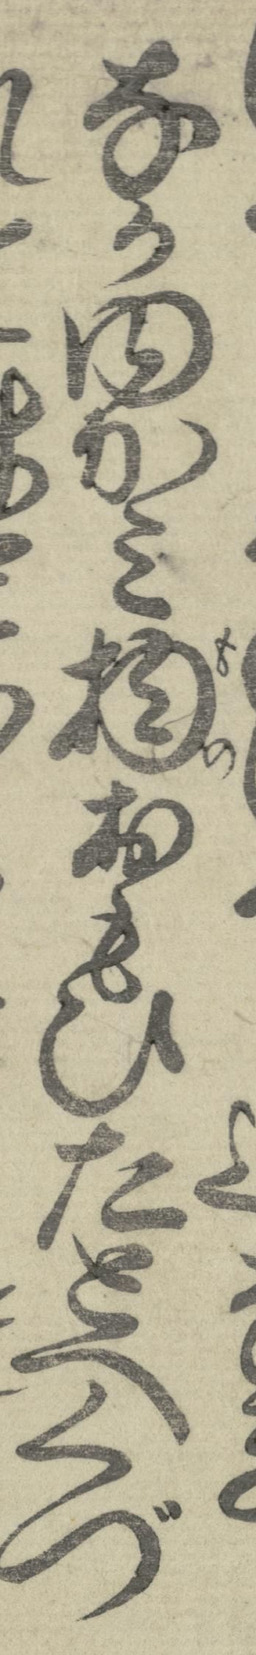なかゆかみ物おもひたとへくづ
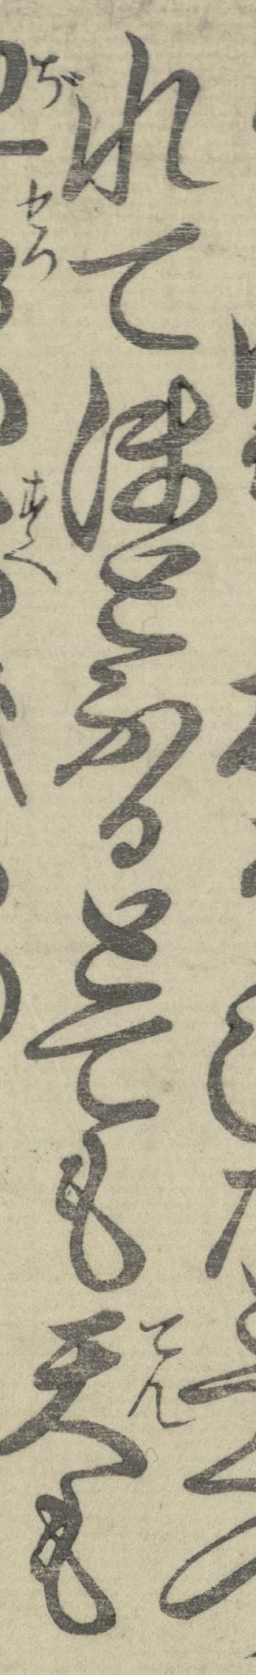れてほとふるとても天も
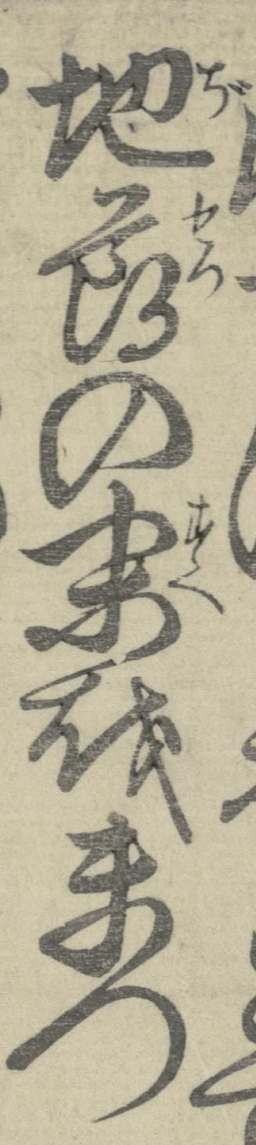地節の末をまつ
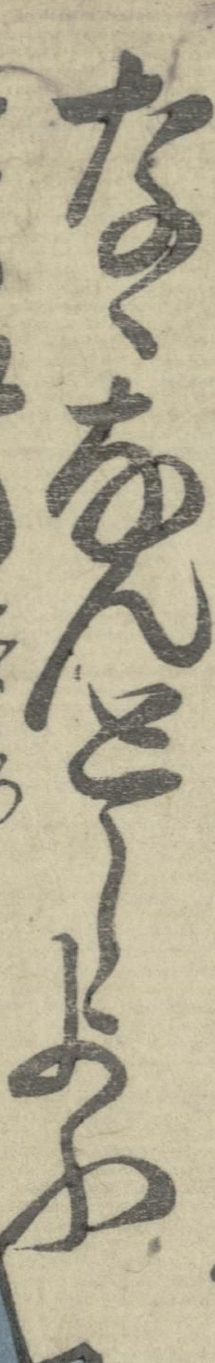なくなんとしよふ
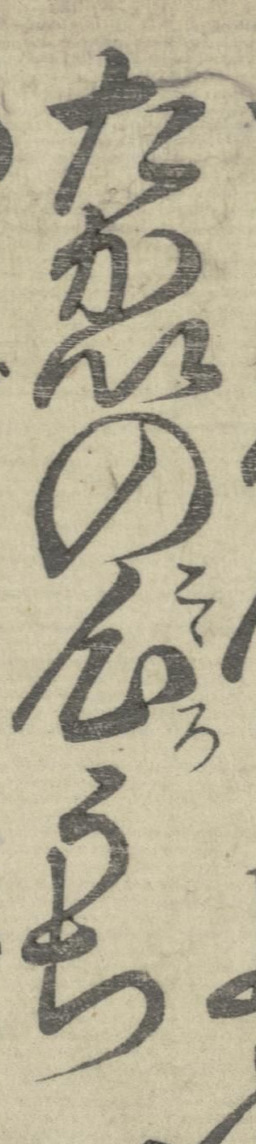たかいの心うち
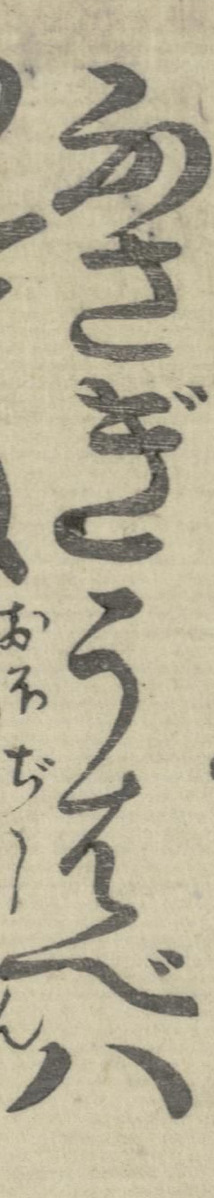ふさぎうはべは
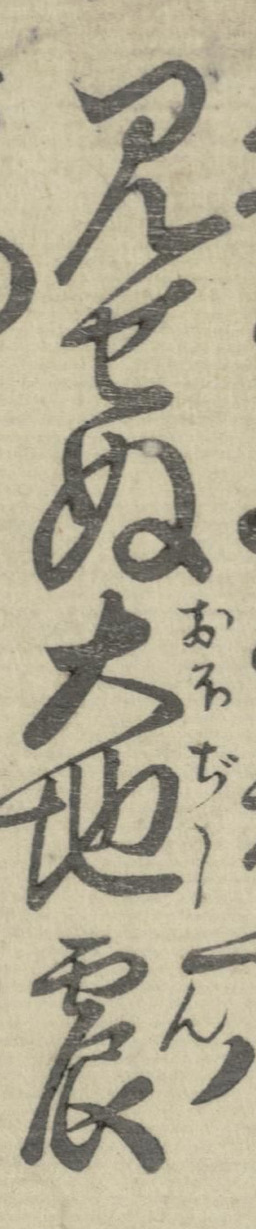見せぬ大地震
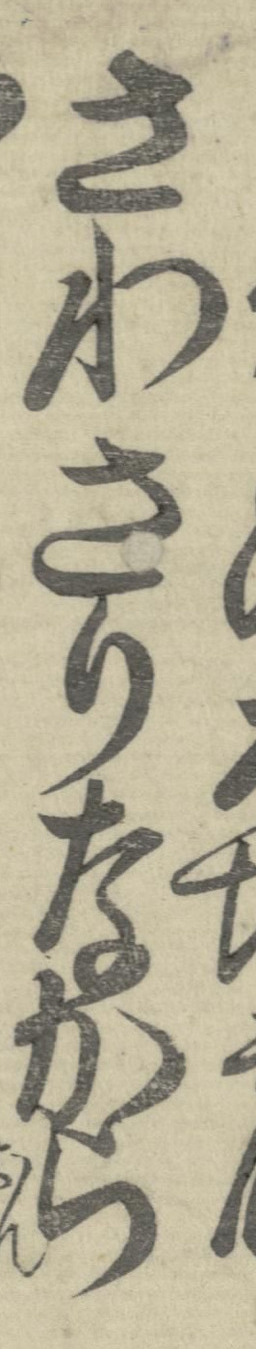さわさりなから
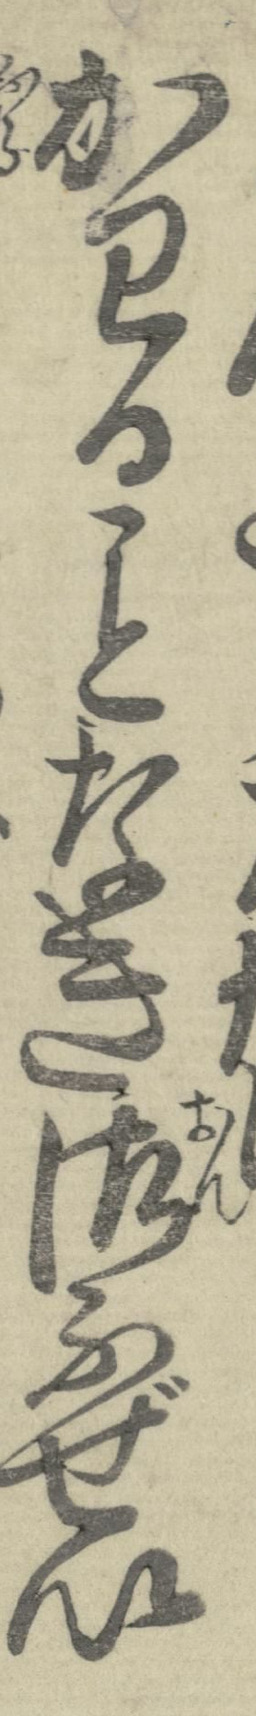かわることなき御ふぜい
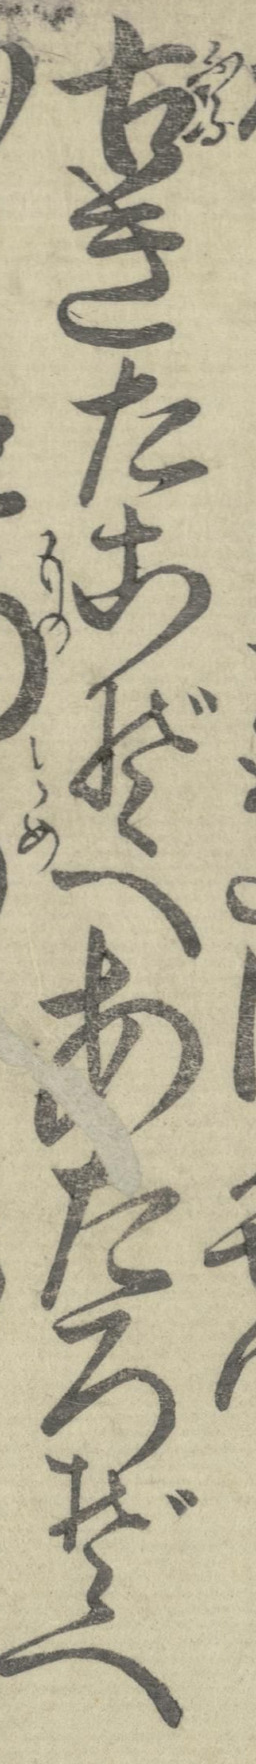古きたこぞへあたろぞへ
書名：五大力
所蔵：東京大学地震研究所図書室 Earthquake Research Institute Library, The University of Tokyo, JAPAN
